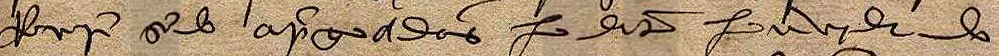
Recerē sēdo ap̄goadas ho dito houvydor do
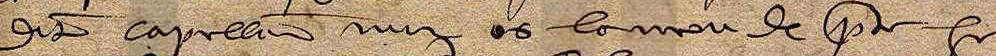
dito capellão mor os lançou de p̄te he
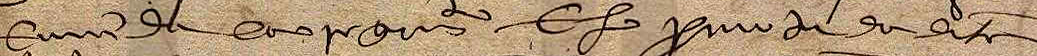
Enmēda e coregimto E ho ꝓmotor da dita
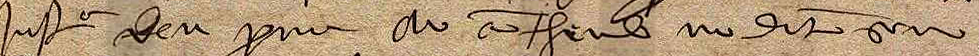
Justa deu ꝓua ao c̄otheudo no dito seu
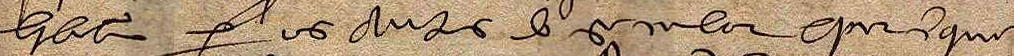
ljbelo ꝑ os Autos do secular e per ēque
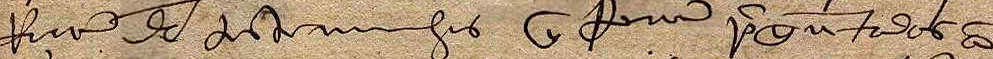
Riçā de testemuhas q̄ forā p̄gūtadas c̄o
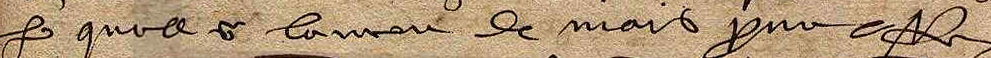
ho quall se lançou de mais ꝓua e ffoy
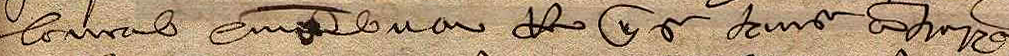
lançado e mādou ao Reo q̄ se teuese c̄otrarya
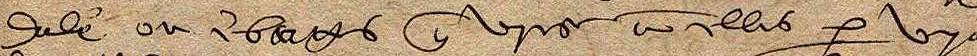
dade ou ēbargos q̄ vjese c̄o elles ꝑ vya
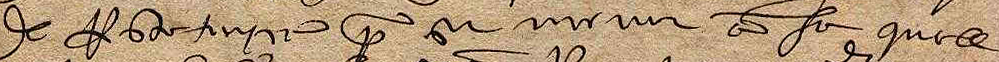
de Restetuyçā p̄o ser menor c̄o ha quall
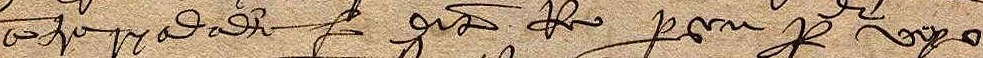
c̄otraryadade ho dito Reo ꝑ seu ꝓdor veyo
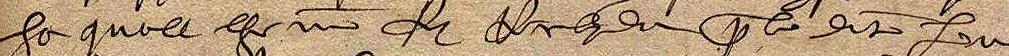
ha quall lhe nō foy Recebyda p̄lo dito hou
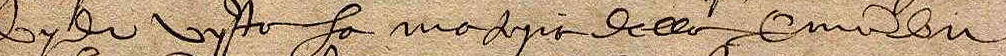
vydor vysta ha materia della E mādou
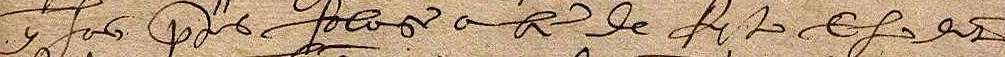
q̄ has p̄tes falasē a bē de feyto E ho dito
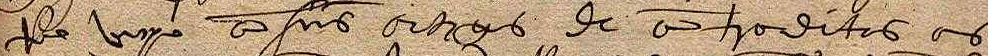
Reo veyo c̄o hus̄ artygos de c̄otraditas as
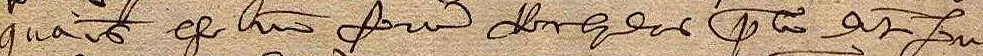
quaes lhe nō forā Recebydas p̄lo dito hou
